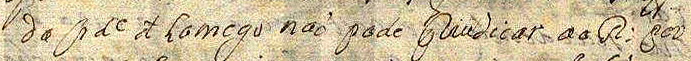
da Cide d̄ Lamego naõ pode preudicar ao R. por
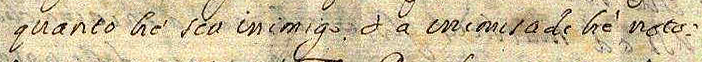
quanto he seo inimigo e a inimisade hè noto
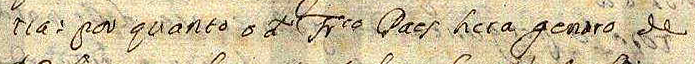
ria: porquanto o d̄ Frco Paes hera genrro de
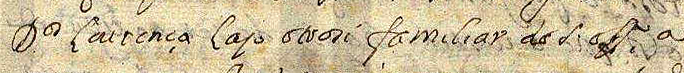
D.os Lourenço Lajo otrosi familiar do s. off.o a
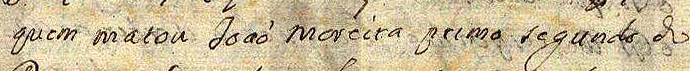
quem matou Ioaõ moreira primo segundo do
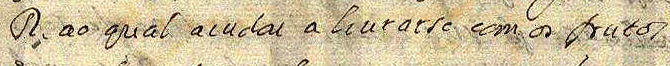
R. ao qual aiudou a liurarse com os frutos
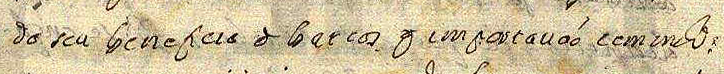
do seu beneficio d barcos q̄ emportauaõ comendo:
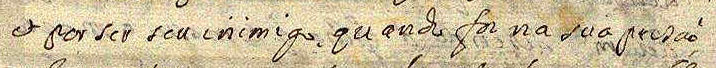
& por ser seu inimigo, quando foi na sua prizaõ
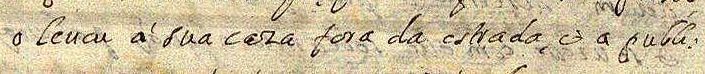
o leuou à sua caza fora da estrada, & a publi
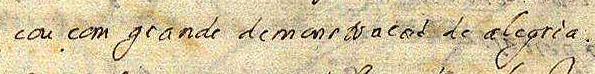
cou com grande demonstraçaõ de alegria.
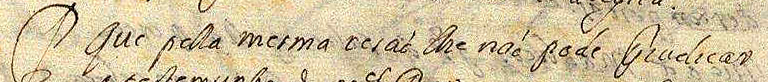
P que pella mesma resaõ lhe naõ pode p̄iudicar
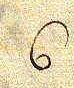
6
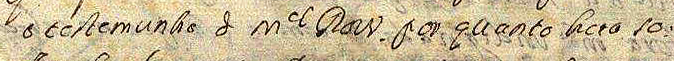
o testemunho d M.el Roiz̄ porquanto hej
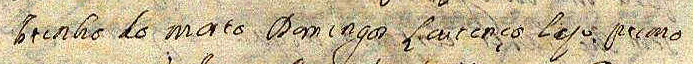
brinho do morto Domingos Lourenço lajo, primo
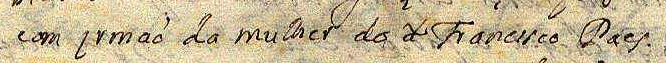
com jrmaõ da mulher do d̄ Francisco Paes.
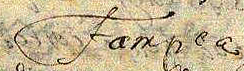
Fam pca
